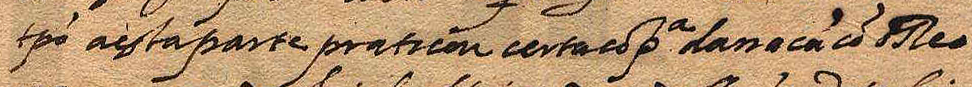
tpō a esta parte praticou certa cōpa da naçā cō o Reo
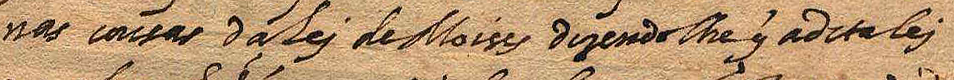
nas cousas da Lej de Moises dizendolhe q̄ a dita lej
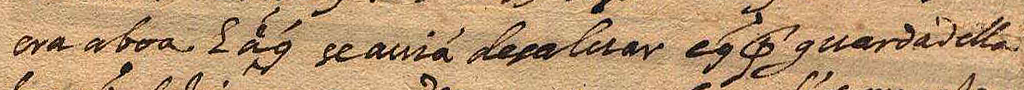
era a boa E a ē q̄ se auiā de saluar e q̄ p̄ guarda della
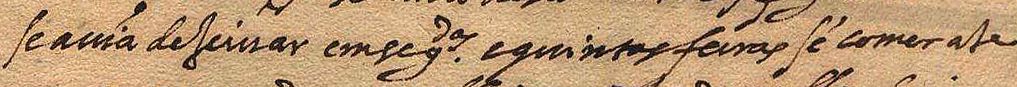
se auiā de Jeiuar em segdas. e quintas feiras sē comer ate
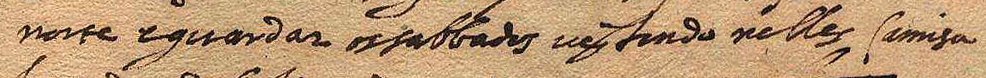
noite e guardar os sabbados uestindo nelles Camisa
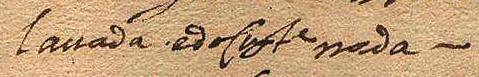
lauada. e do Custe nada -
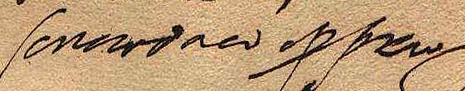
Concorda cō o ꝓprio
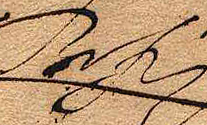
Br frz̄.
